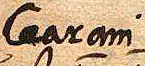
Cearam
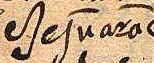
e Jejūarā
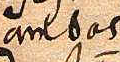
ambos
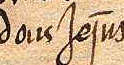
dous Jejūs
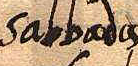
sabbados
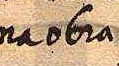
na obra
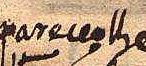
pareceolhe
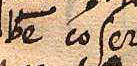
bē cōser
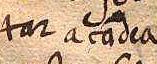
tar a cādea
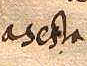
a sesta fra
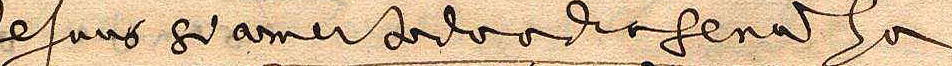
JeJuus sē comer todo o dia senā ha
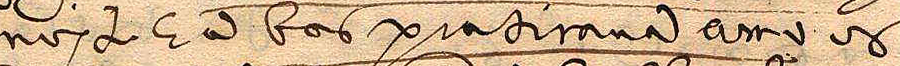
noyte E ābos praticauā como os
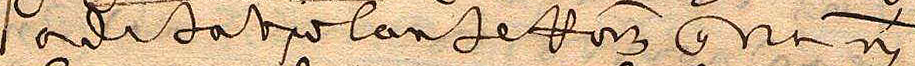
a dita vyolante Rōiz q̄ era mto
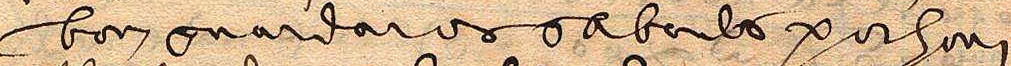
bom guardar os sabados por hom
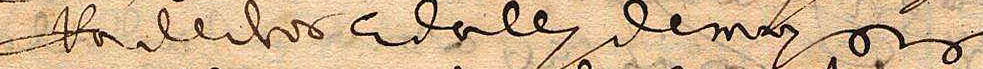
Ra de deos E da lej de mojses
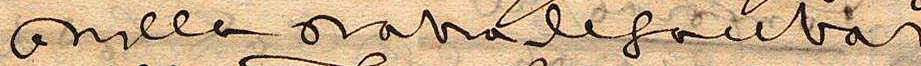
q̄ nella se avia de sallvar
